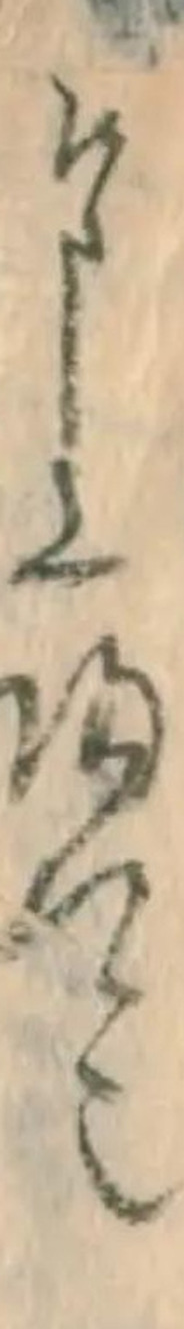被申上帰郷也
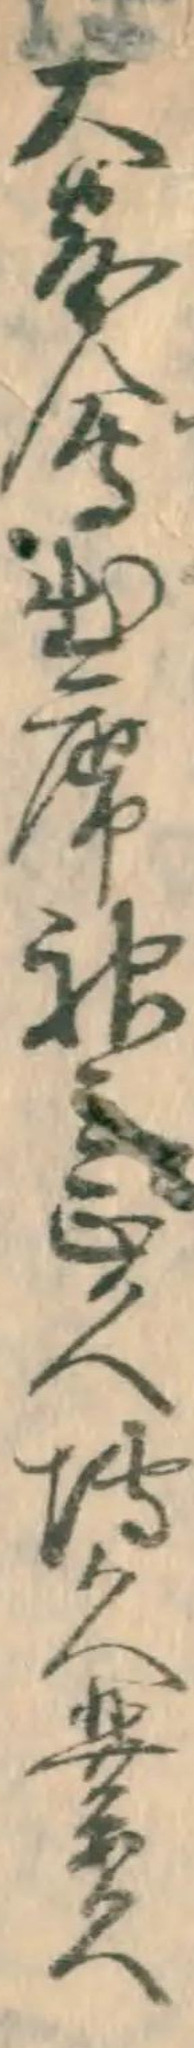一大寄会出席神主正久博久業久
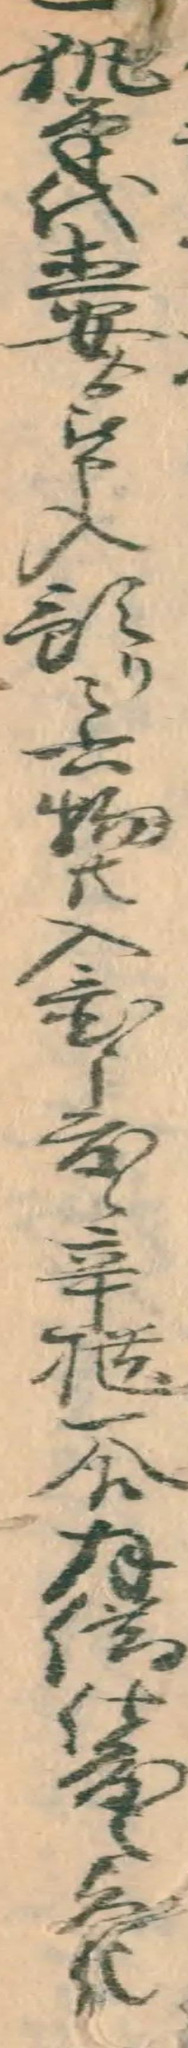一執筆代直安ゟ被申入預り之書物共入置申度候辛櫃一合拝借仕度之旨也
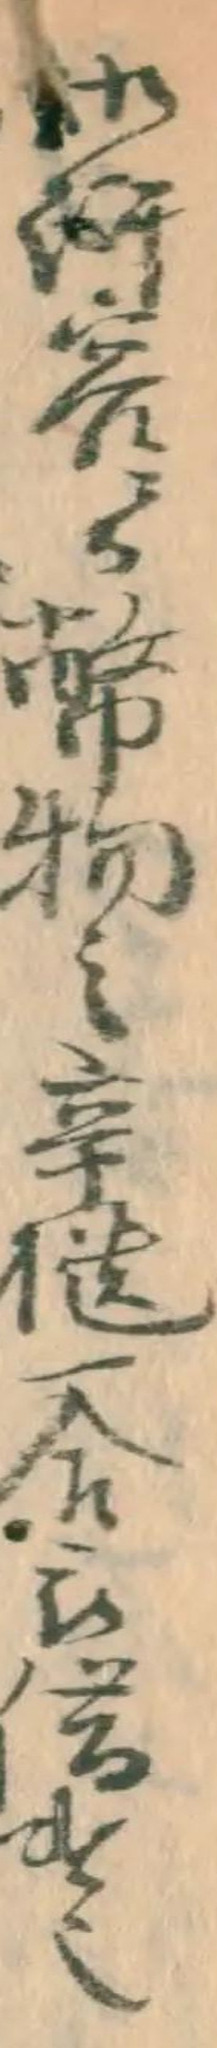御許容ニ而幣物之辛櫃一合被借遣也
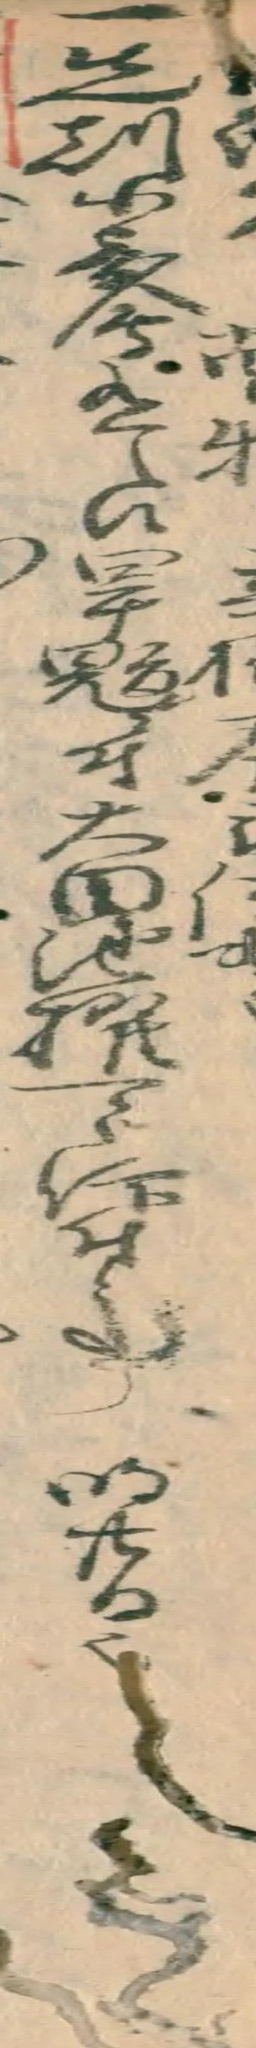一先刻小寄会有之候旱魃ニ付大田池撰可被仰付候事明廿日也
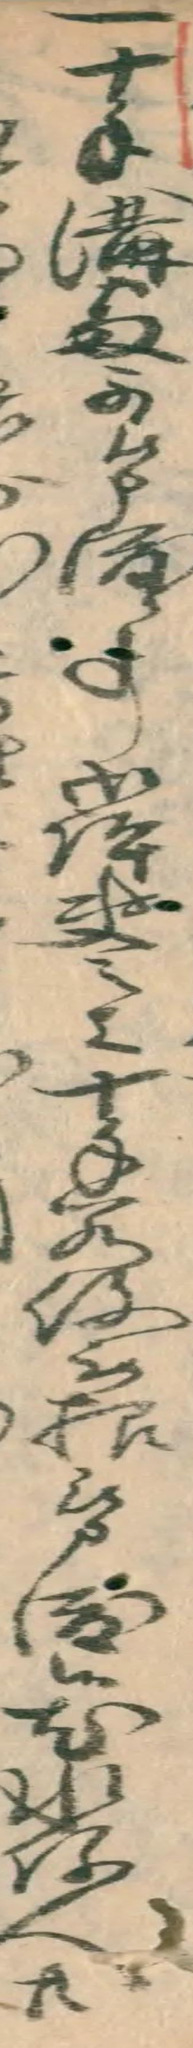一十手溝番可被申渡候事御評決之上十手若役被招被申渡候尤水役人共
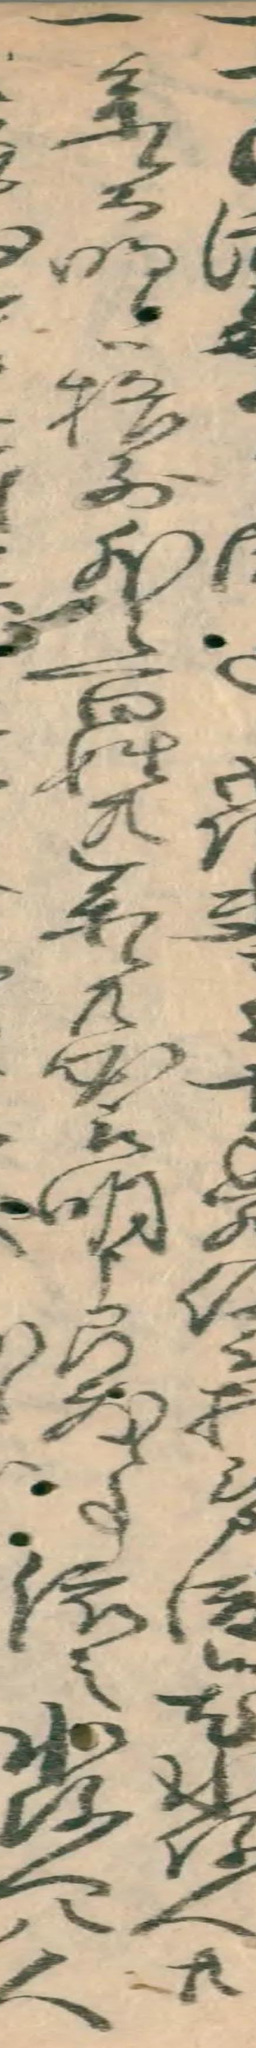参候而明日ハ格別外之百姓共参候共必被明申間敷候事依之水役人八人
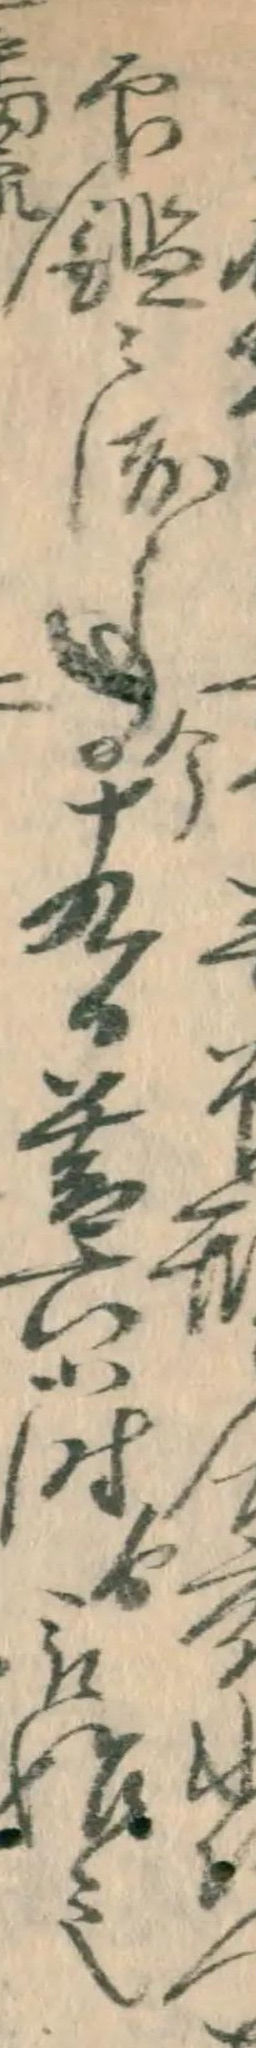印鑑被渡候事今十九日暮六ツ時ゟ被始也
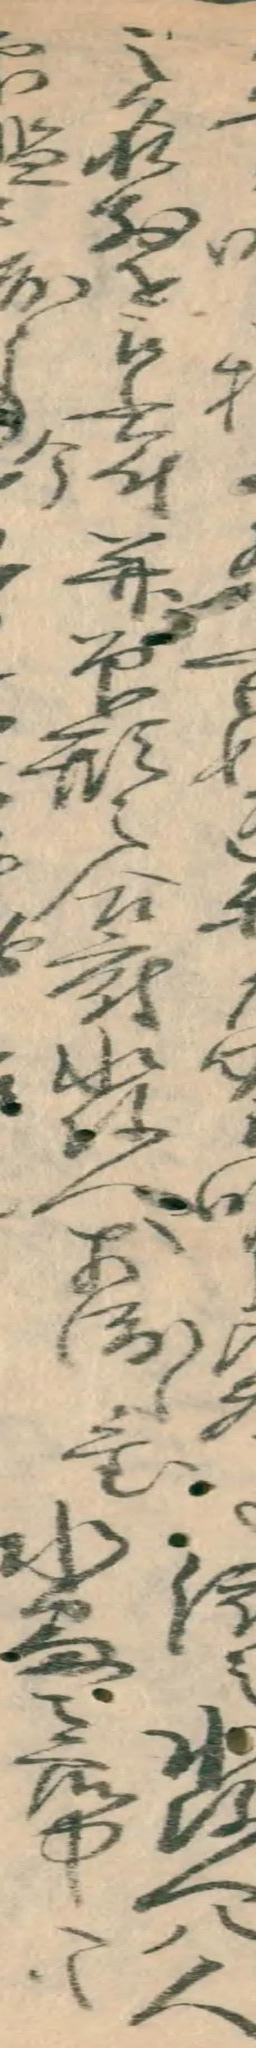之名前を被書付幷印形之合府水役人へ相渡し置水番之衆中へも
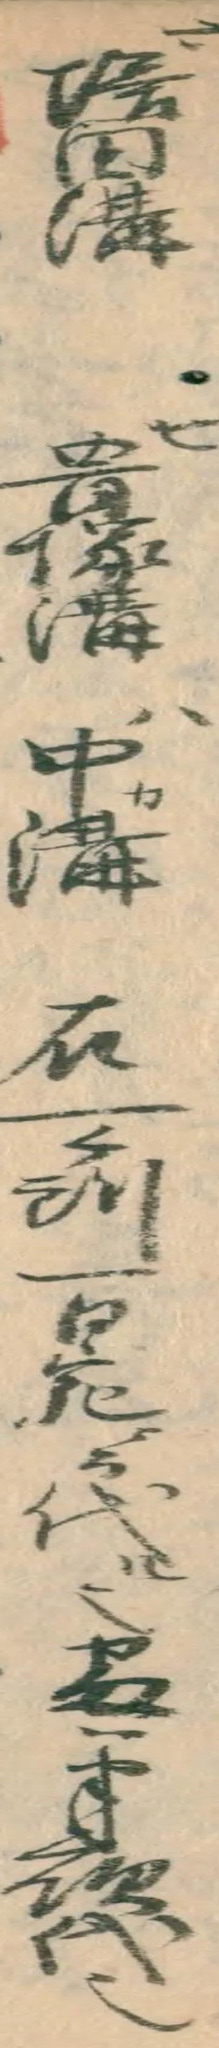六塔田溝七貴塚溝八中カ溝右一ヶ所一日宛ニ而代ル也番ハ半夜代也
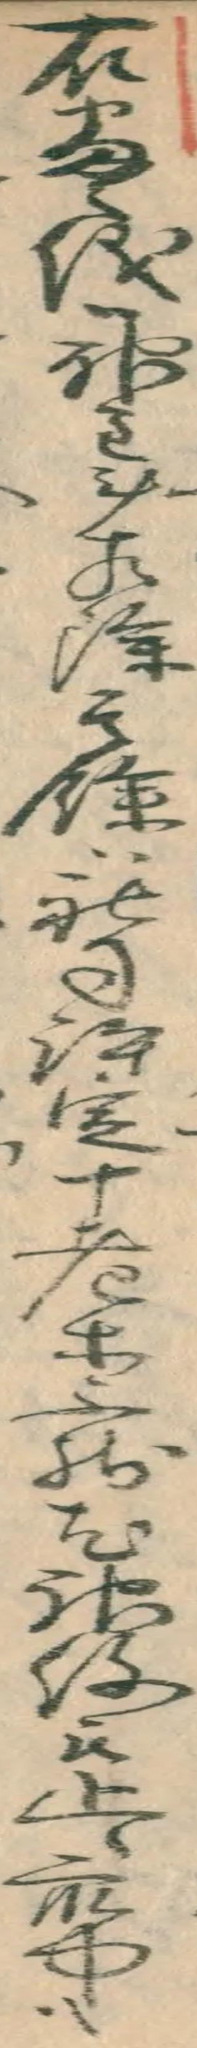右番之儀ハ神主計相除其余ハ社司評定十老等不残尤神役被止候衆中も
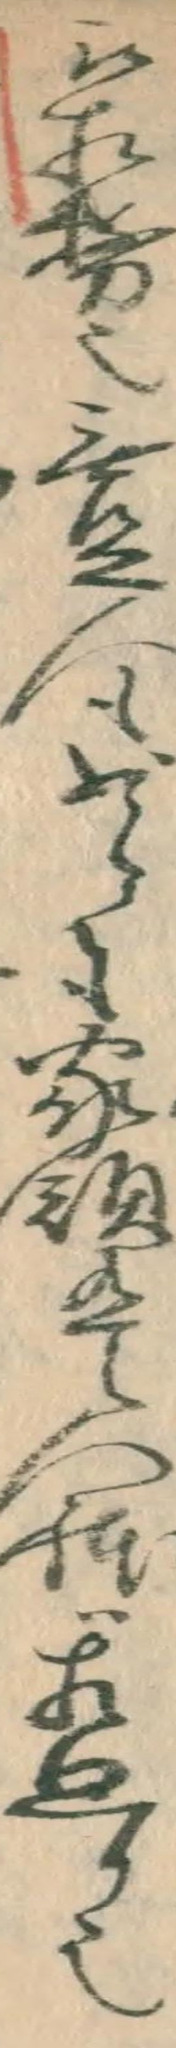被相務也無足人も少々ニても家領有之人体ハ相廻り也
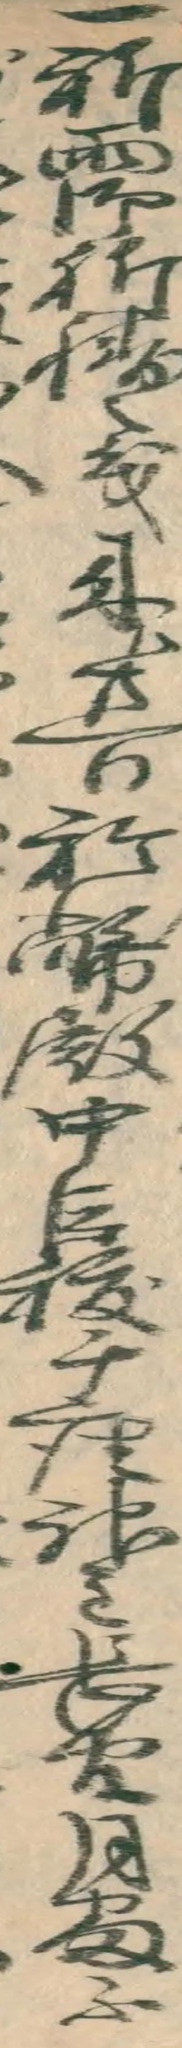一祈雨御祈祷之義来ル廿一日於幣殿中臣祓千座神主長官月番不
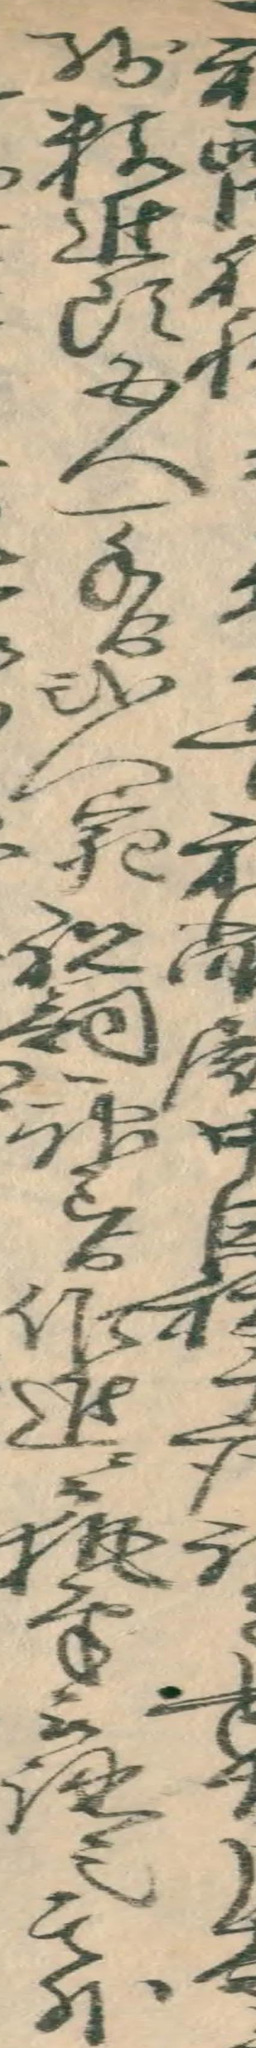残精進頭五人一手ゟ弐人宛祝詞ハ神主ゟ作進ニ而執筆被認也其外
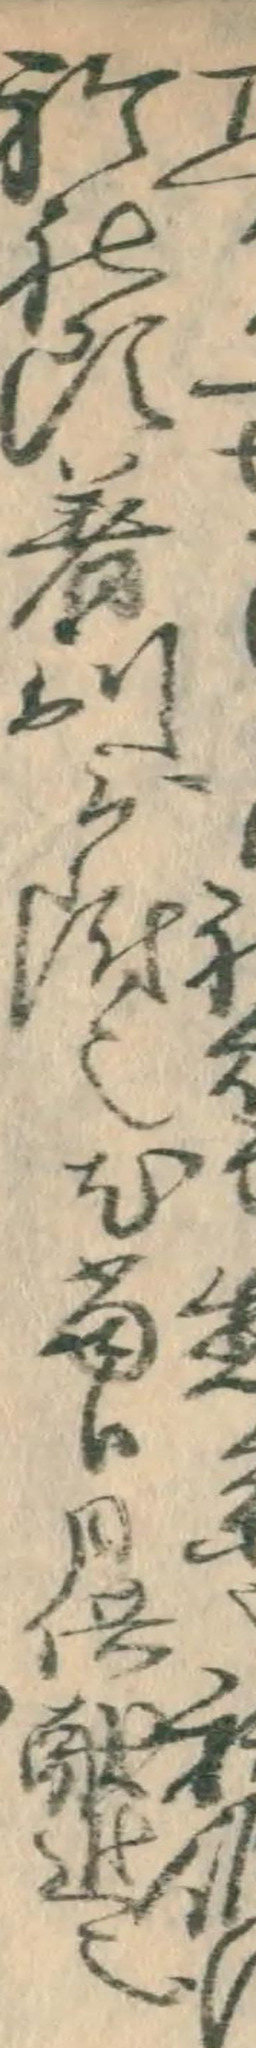於社頭着到ニ被付也尤当日日供献進也
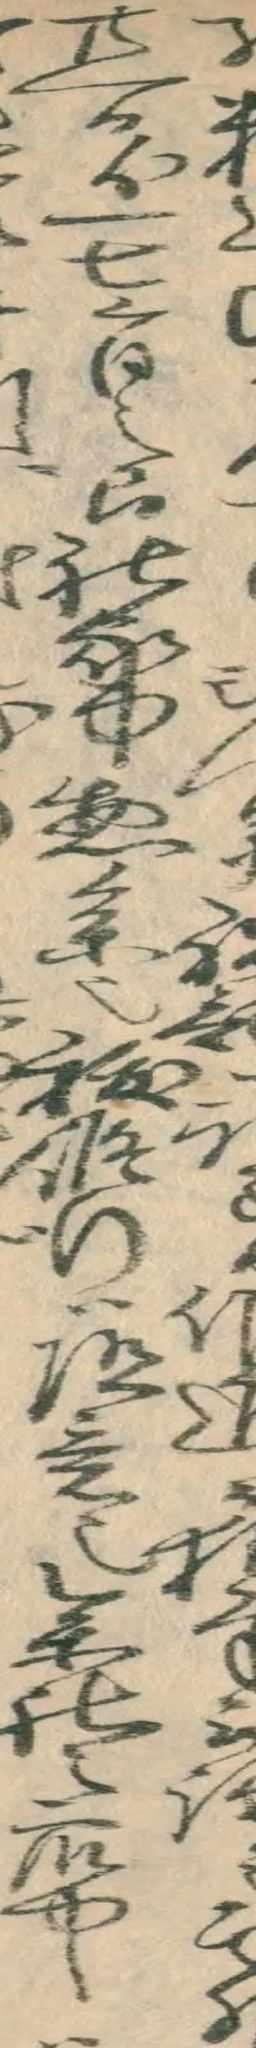廿一日ゟ一七ケ日之間社家中惣参也祓修行ハ随意也参社之衆中ハ
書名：賀茂社記録. 第58冊
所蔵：国立国会図書館 National Diet Library, JAPAN
